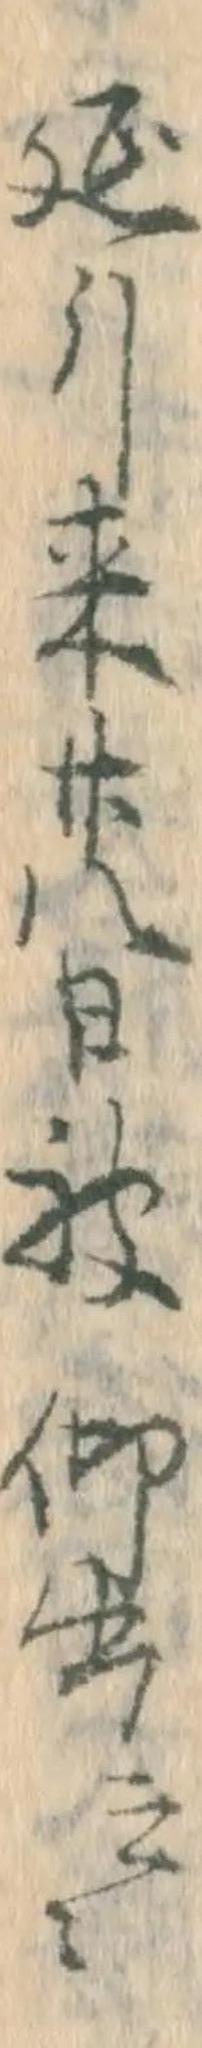延引来廿八日被仰出云々

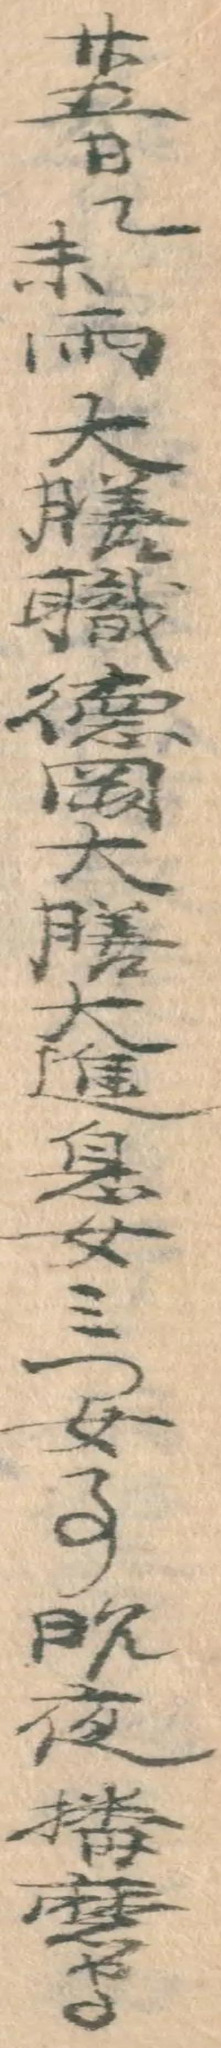廿五日乙未雨大膳職徳岡大膳大進息女ミつ女事昨夜播磨守
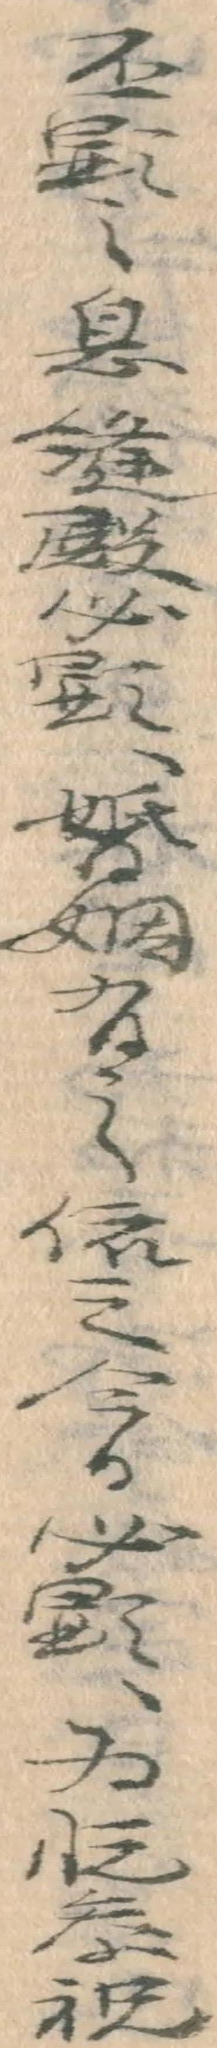丞顕之息縫殿必顕へ婚姻有之依之今日必顕へ為悦参祝
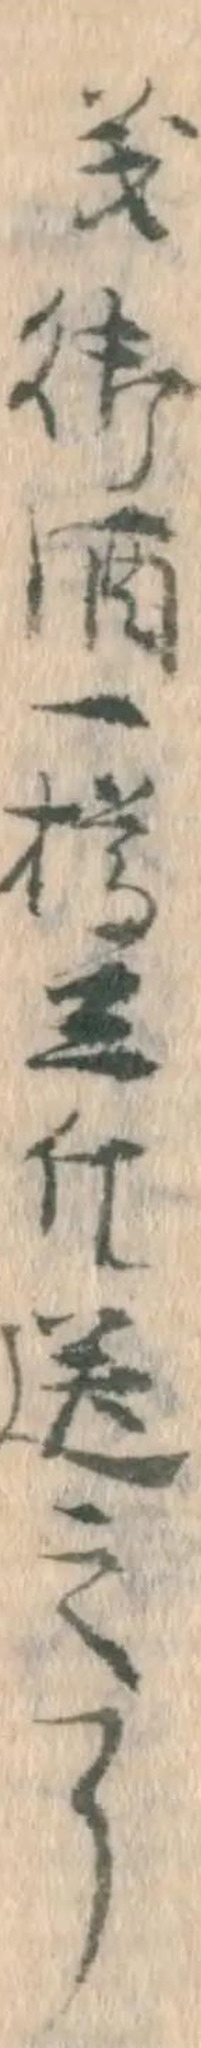義御酒一樽三升送之了
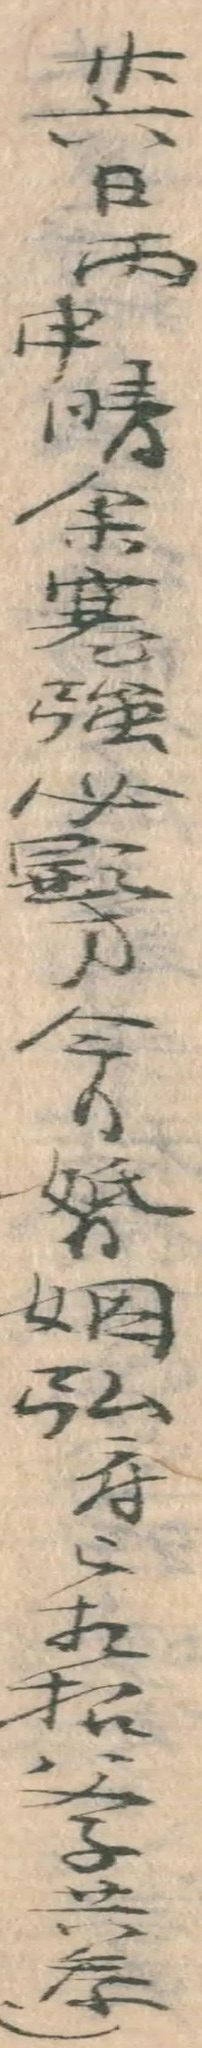廿六日丙申晴余寒強必顕方今日婚姻弘ニ付被相招父子共参也
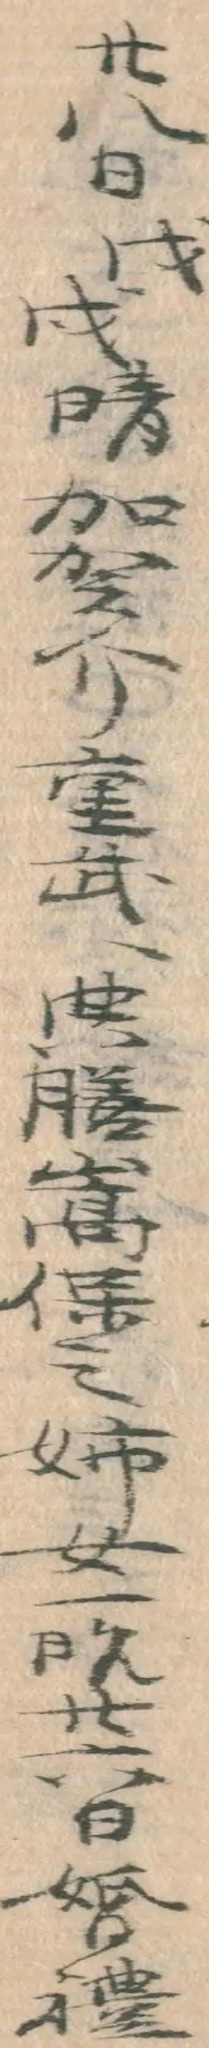廿八日戊戌晴加賀介重武へ典膳嵩保之姉女一昨廿六日婚礼
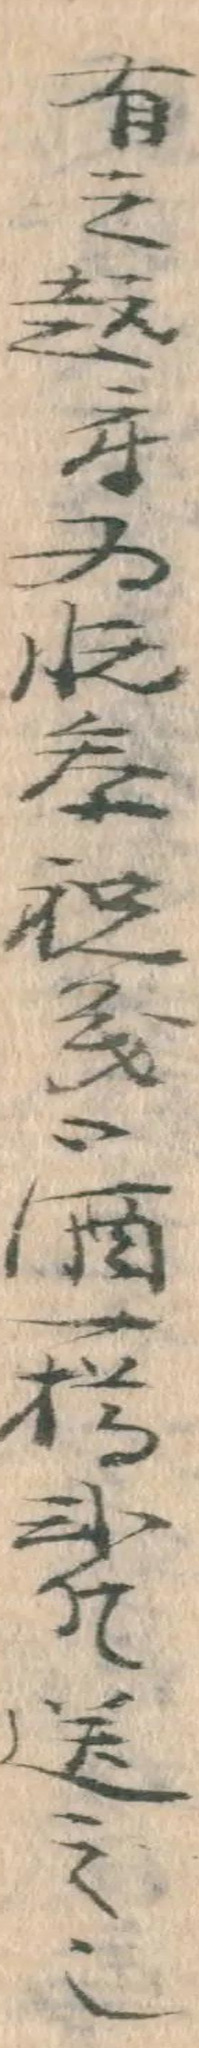有之趣ニ付為悦参祝義御酒一樽弐升送之也
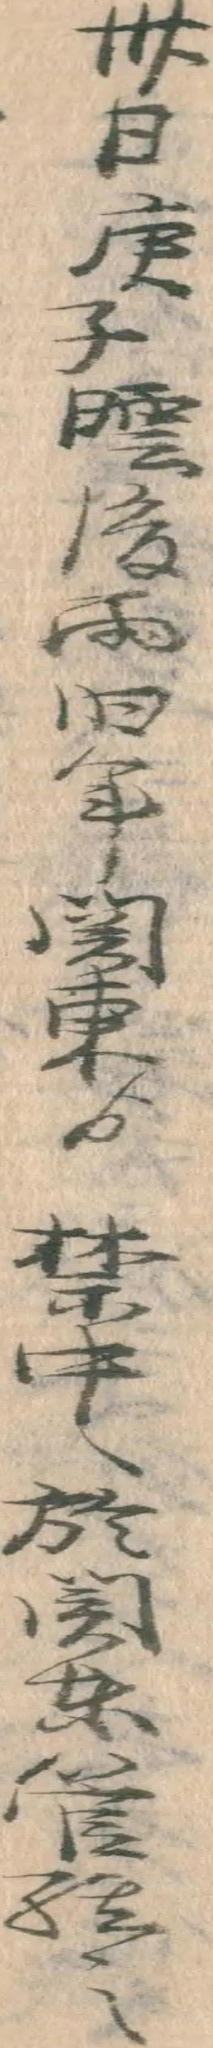丗日庚子曇後雨旧年関東ゟ禁中へ於関東管絃之
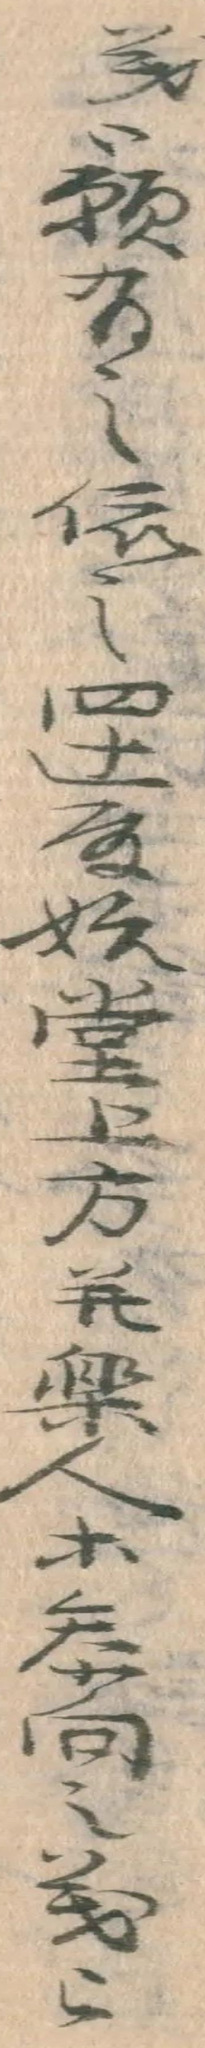義御願有之依之四辻殿始堂上方并楽人等参向之義被
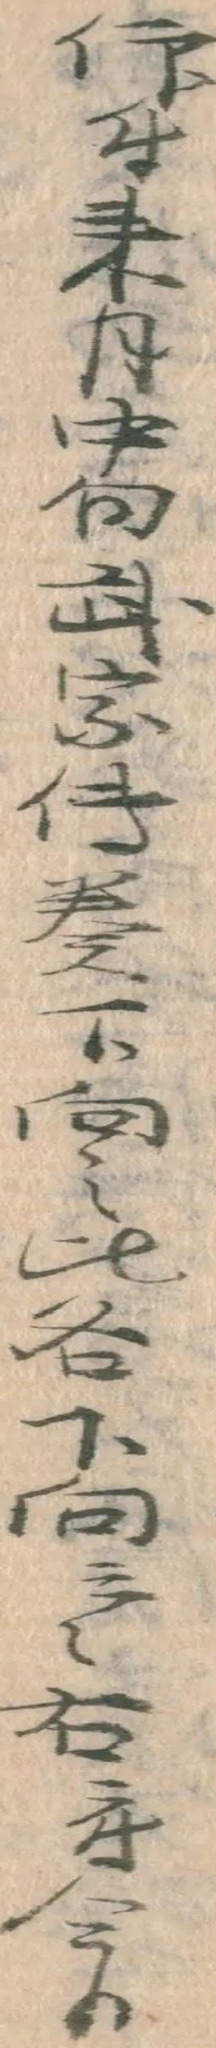仰付来月中旬武家伝奏下向之比各下向云々右ニ付今日
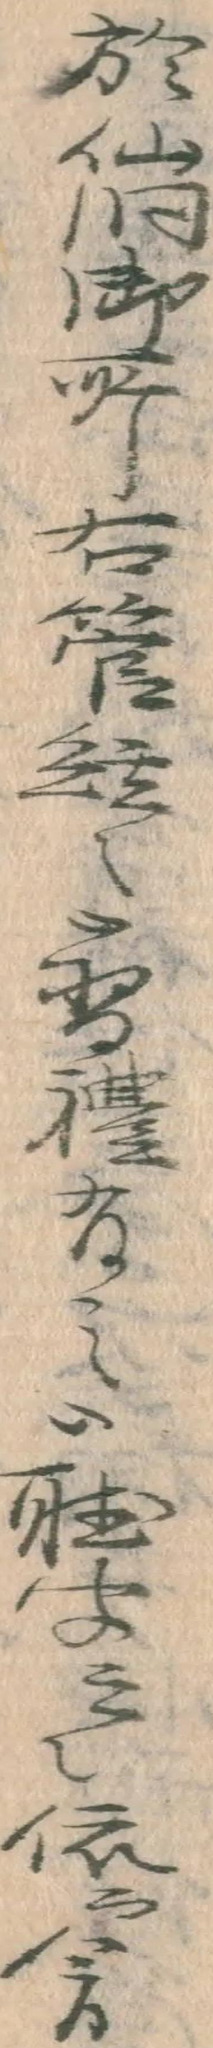於仙洞御所右管絃之御習礼有之御聴聞云々依而今日
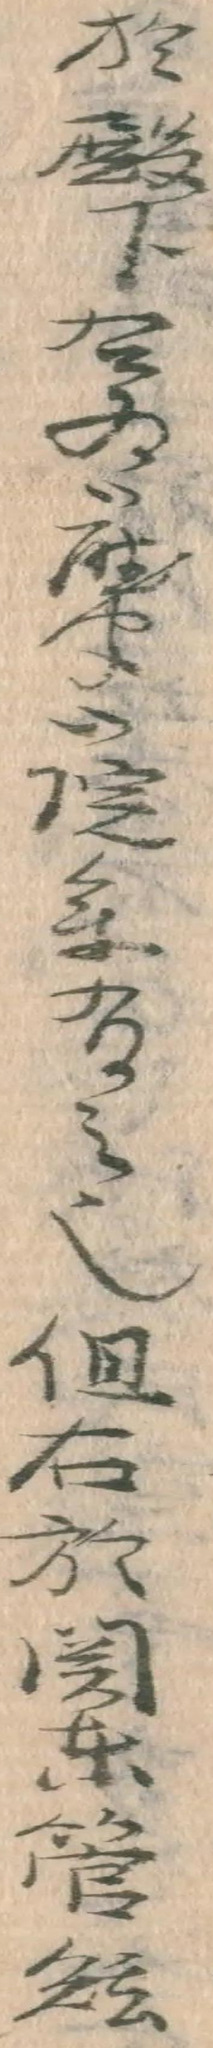於殿下右為御聴聞御院参有之也但右於関東管絃
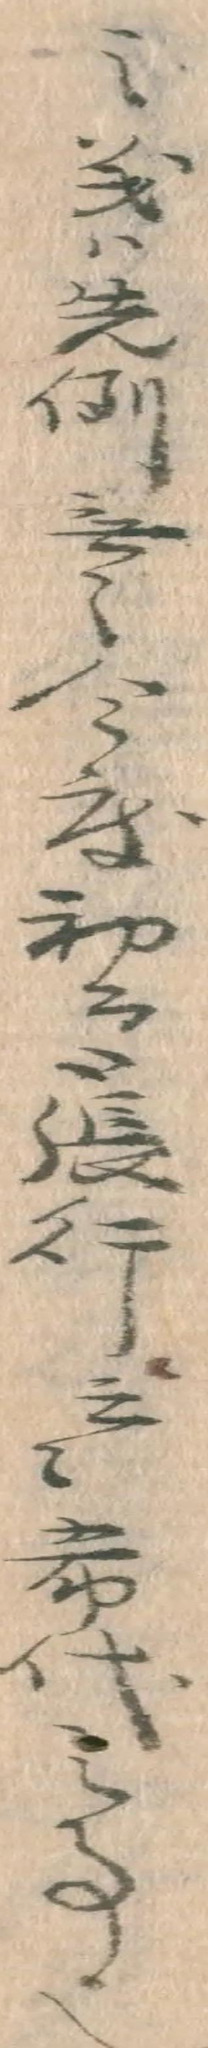之義ハ先例無之今度初而御張行云々希代之事也
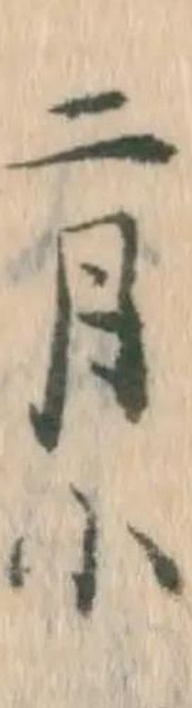二月小
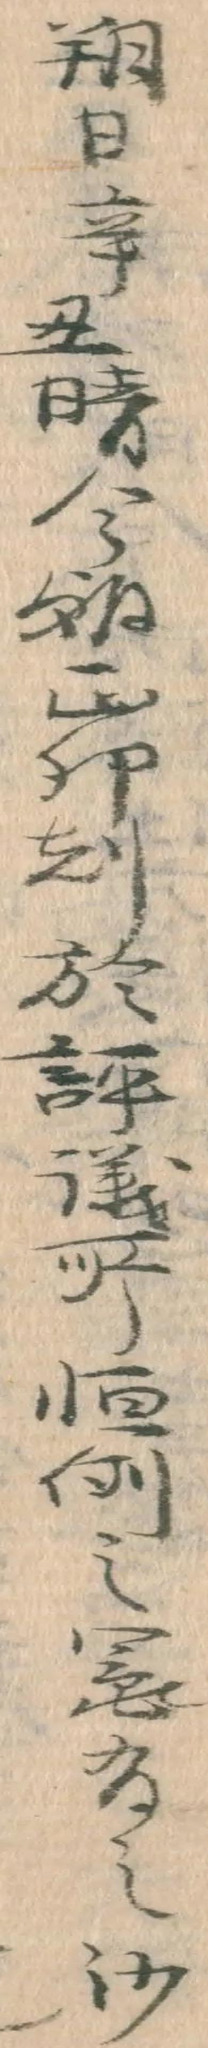朔日辛丑晴今朝正卯刻於評議所恒例之鬮有之沙
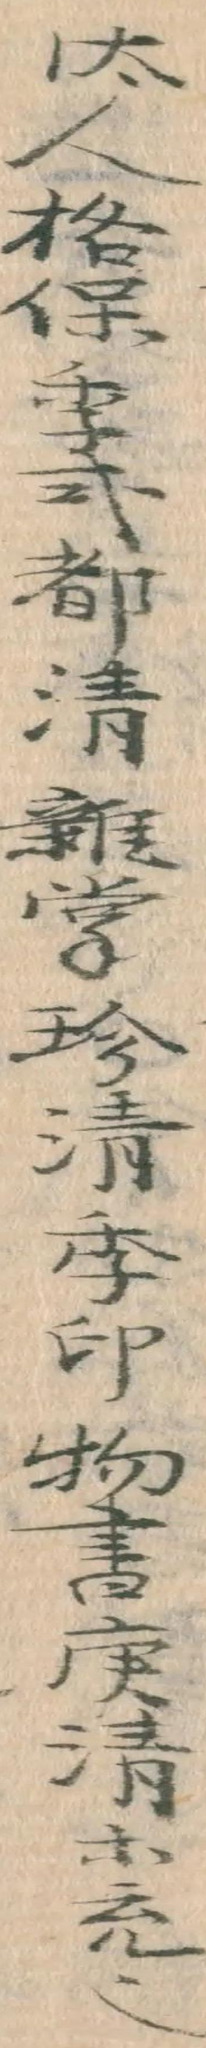汰人格保季式都清雑掌珍清季印物書庚清等充也
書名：賀茂社記録. 第64冊
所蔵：国立国会図書館 National Diet Library, JAPAN
